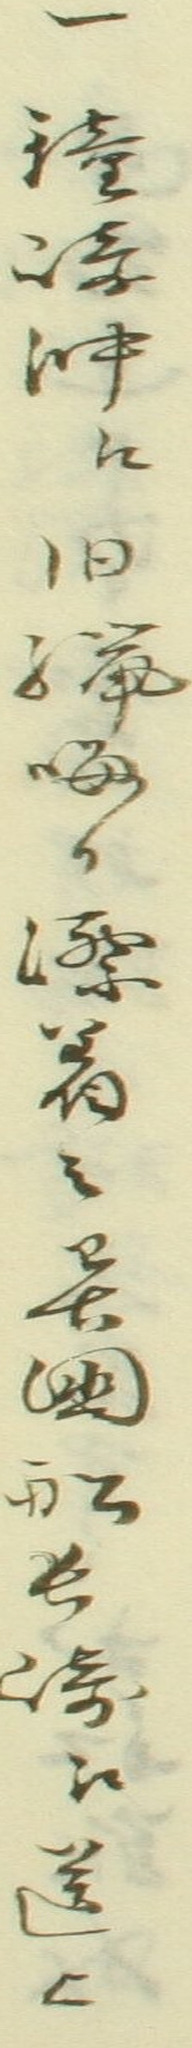一鐘崎沖え旧臘晦日漂着之異国船長崎え送被
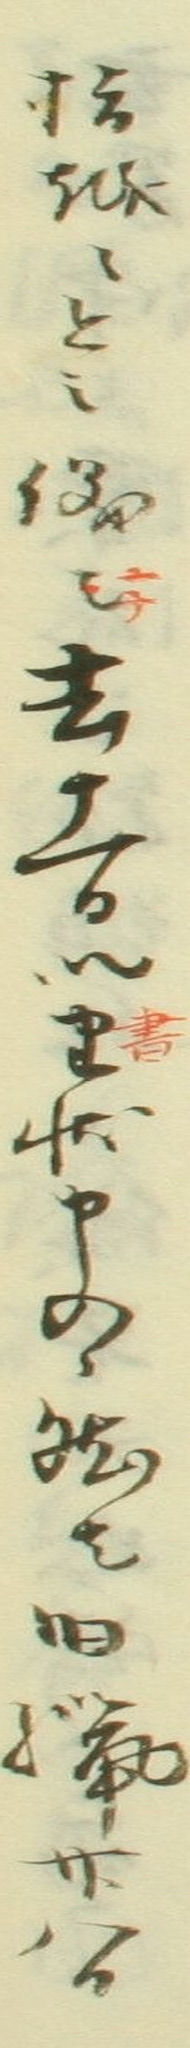差越候と之儀にて去十一日以書状申入候然は旧臘廿八日

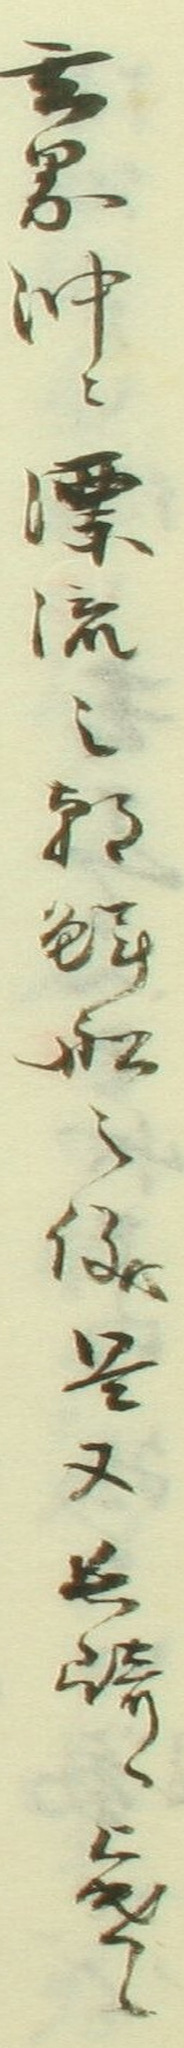玄海沖に漂流之朝鮮船之儀是又長崎へ被遣候
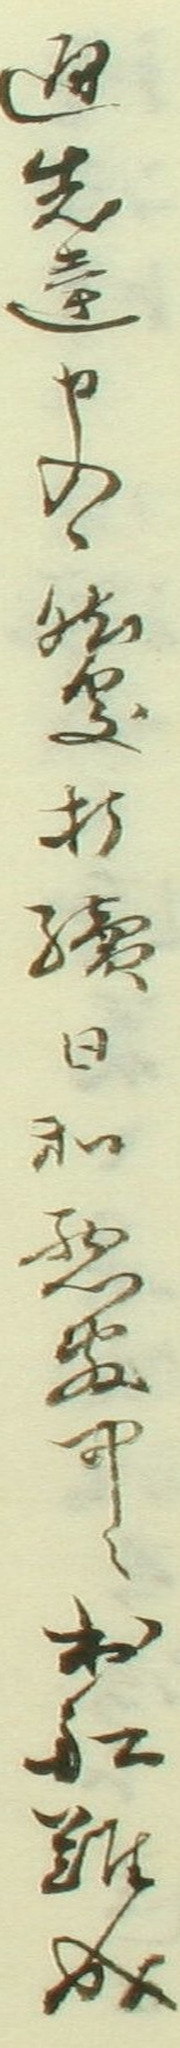通先達申入候然処打続日和悪敷中々出船難成
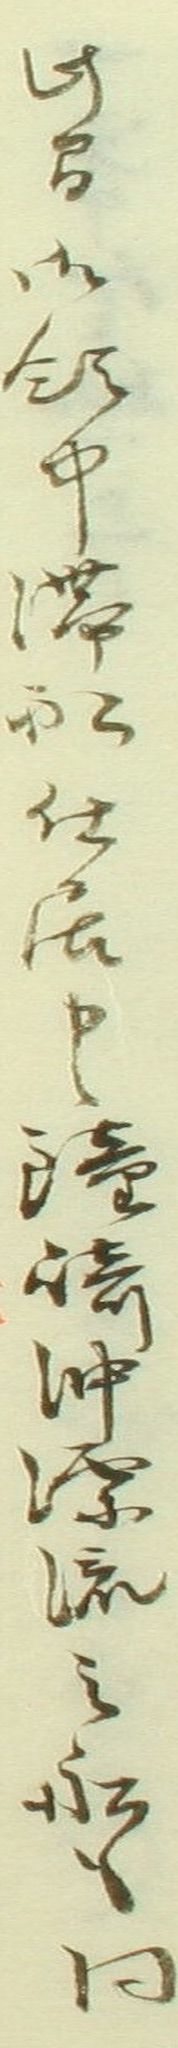此間御領中滞船仕居申候鐘崎沖漂流之船も同
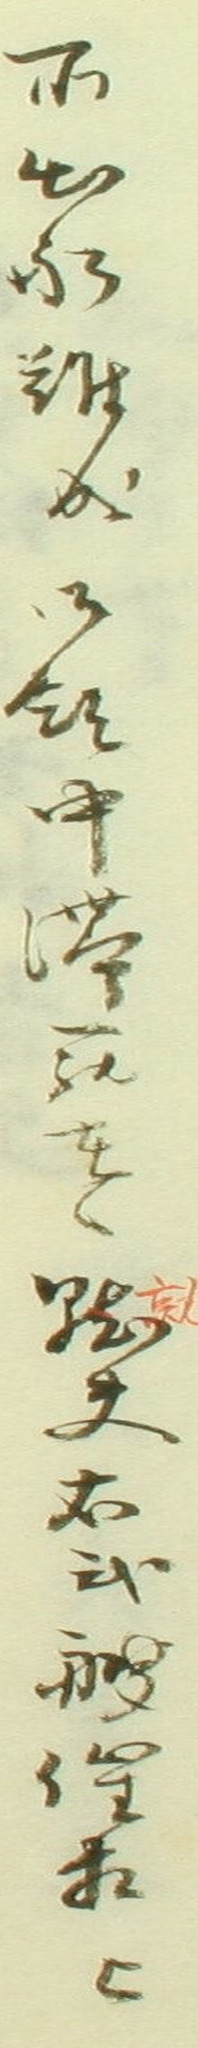所出船難成御領中滞罷在候就夫右弐艘催相被
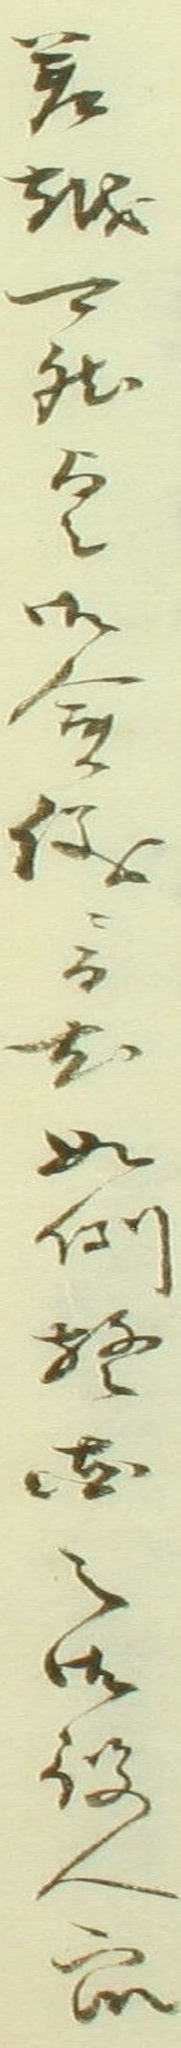差越可然と之御僉儀にて尤如例警固之御役人衆
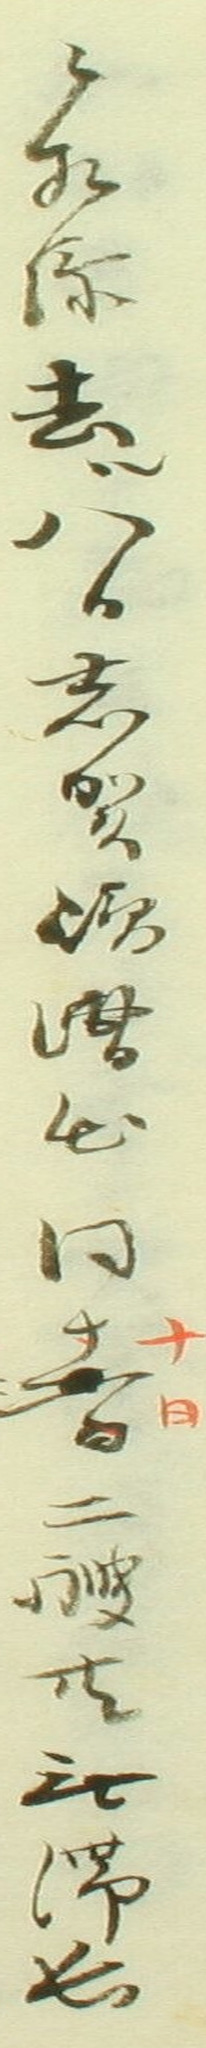に相添去る八日志賀島漕出同十日二艘共無滞長
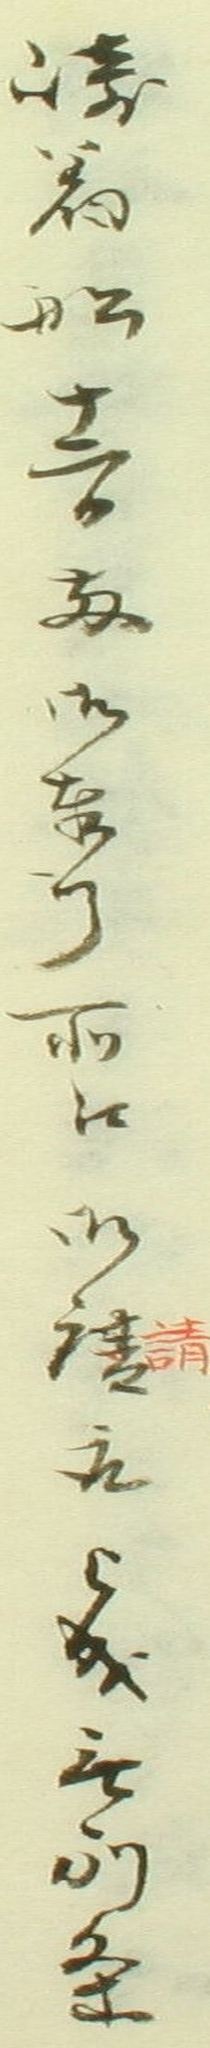崎着船十二日両御奉行所え御請取被成無別条
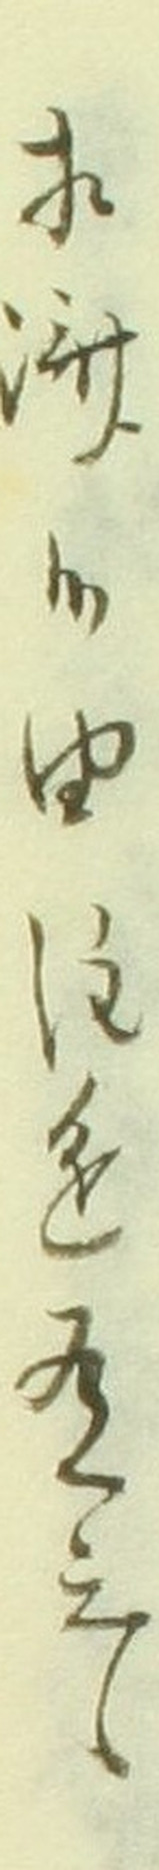相済候由注進有之候
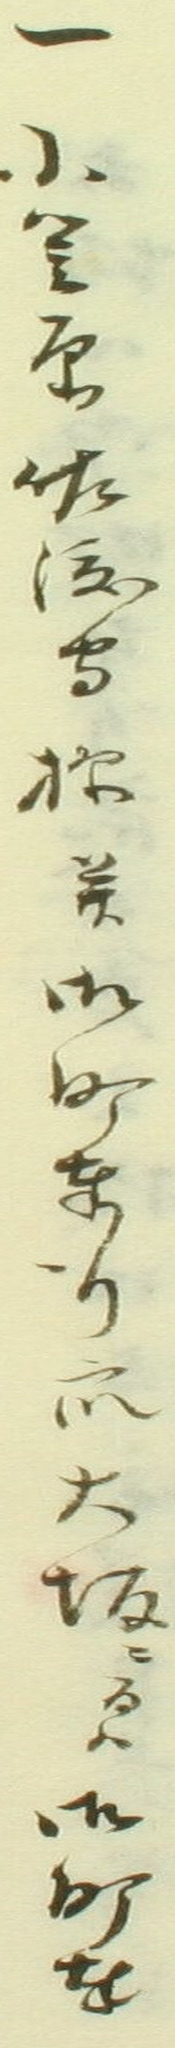一小笠原佐渡守様并御町奉行衆大坂にては御町奉
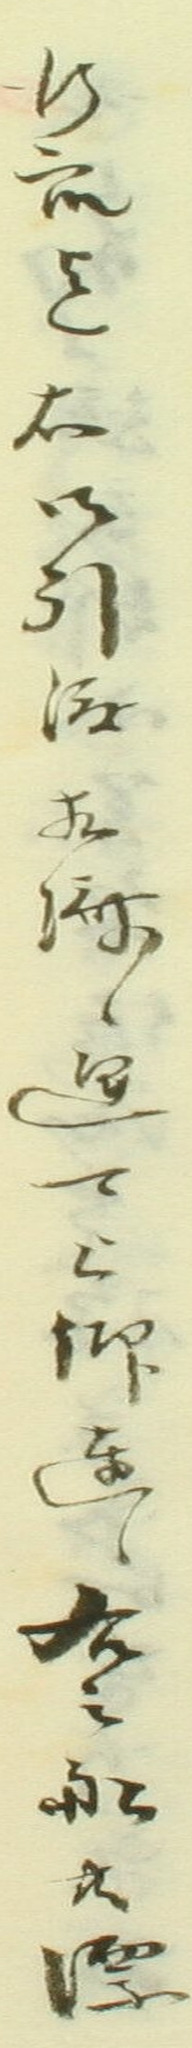行衆迄右御引渡相済候通可被仰達候右之船共漂
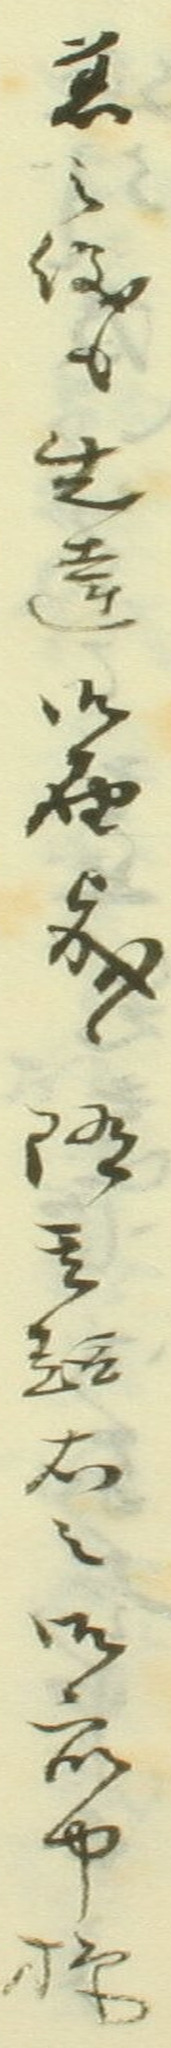着之儀は先達御届被成候随其趣右之御衆中様
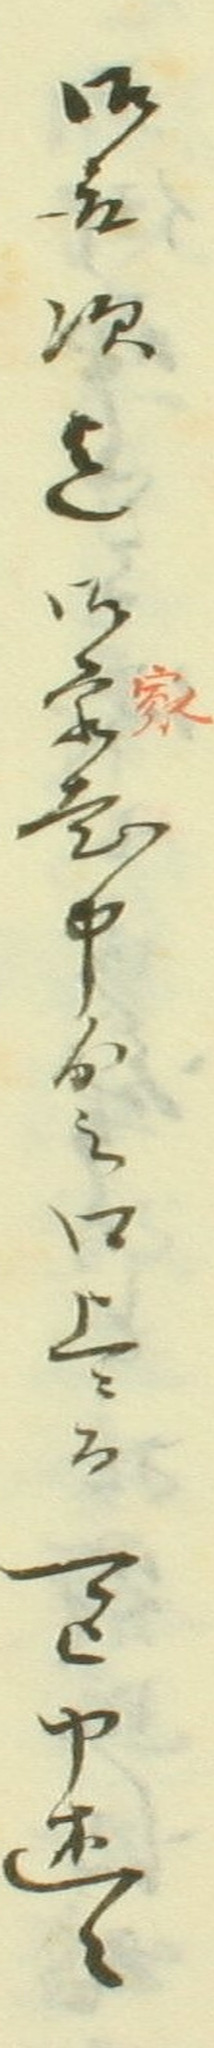御取次迄御家老中よりの口上にて可被申述候
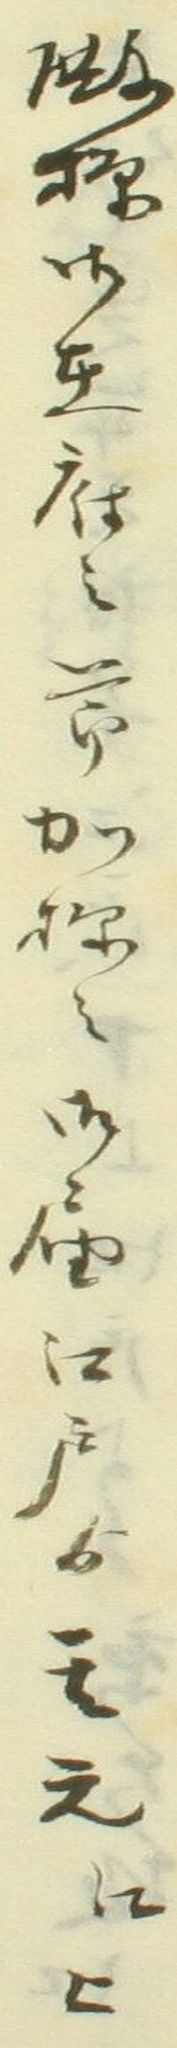殿様御在府之節可様之御届江戸より其元え被
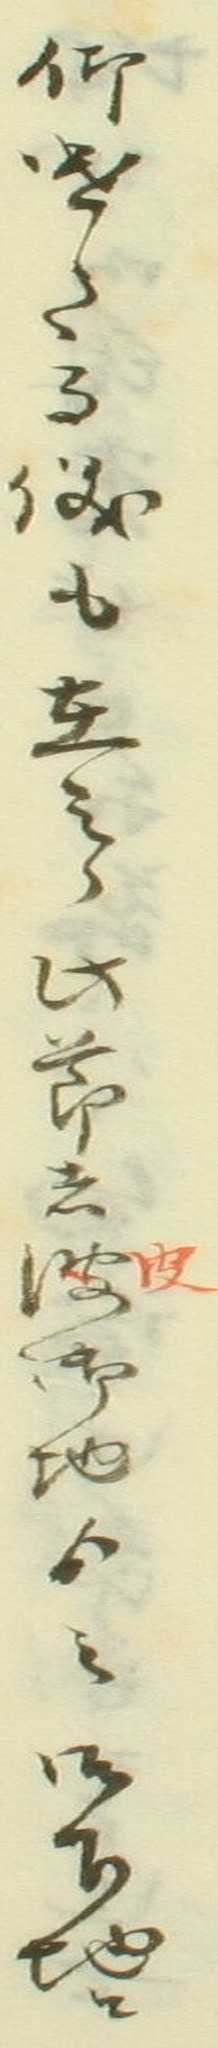仰遣たる儀も在之候此節は彼御地より之御下地に
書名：朝鮮船御領内漂流記 坤
